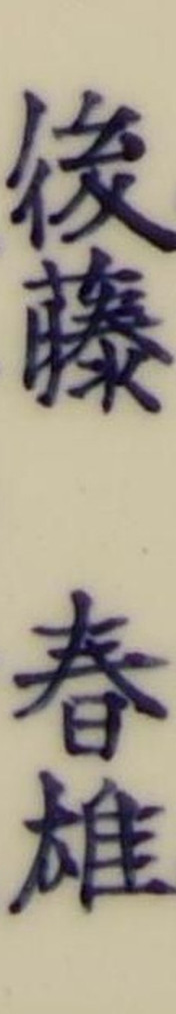後藤春雄
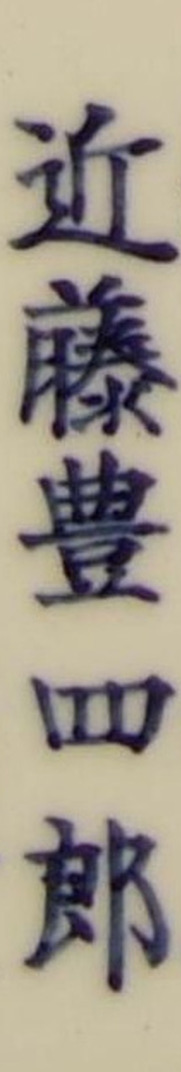近藤豊四郎

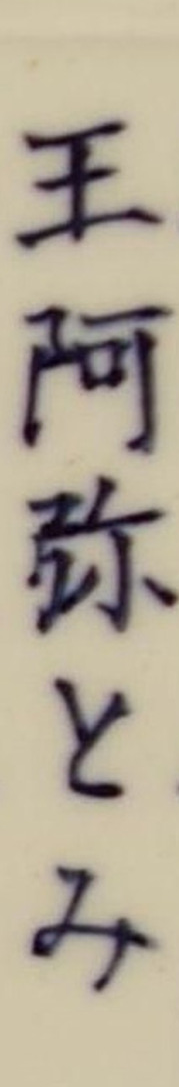王阿弥とみ
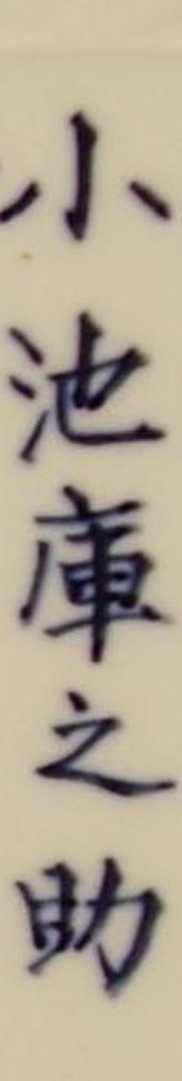小池庫之助
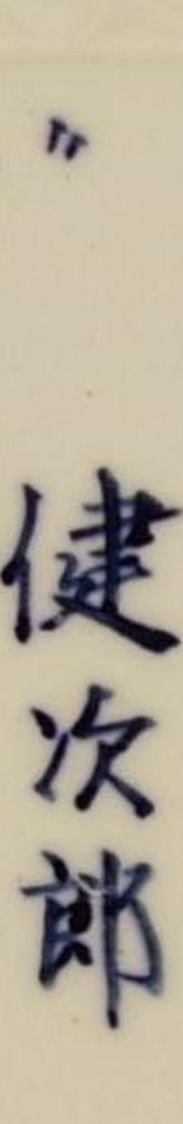健次郎
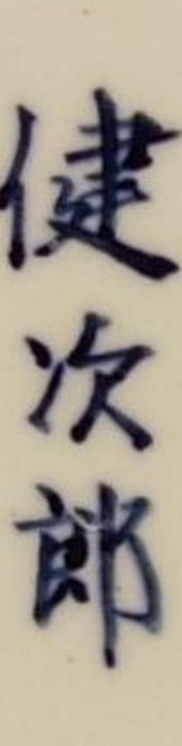健次郎
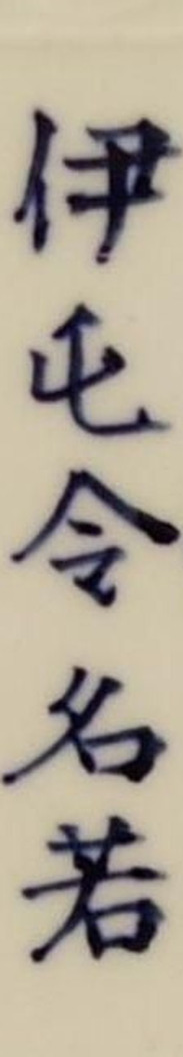伊屯令名若
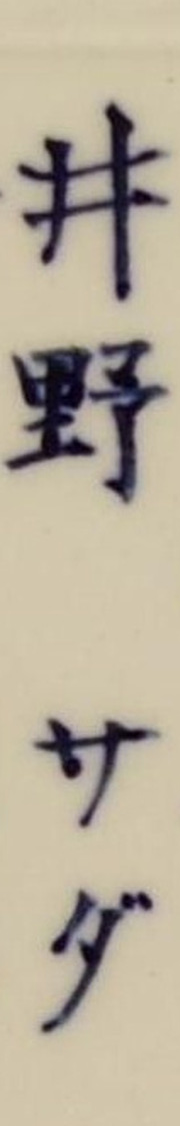井野サダ
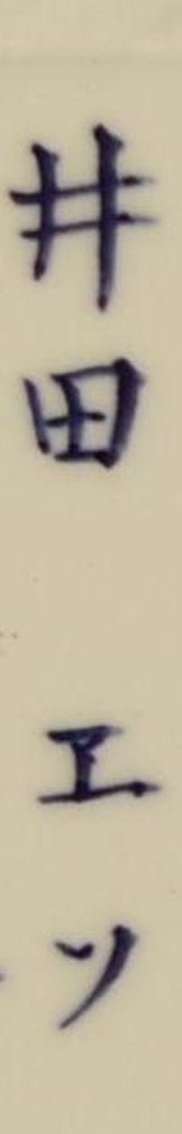井田エツ
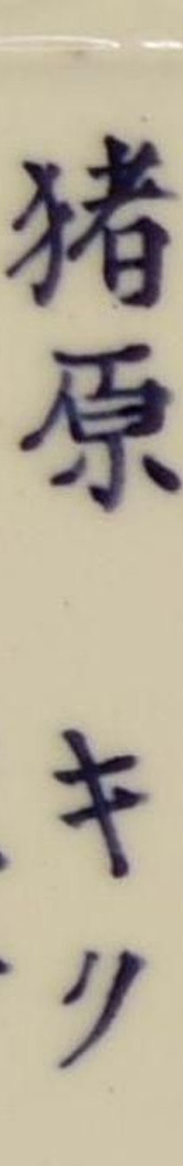猪原キク
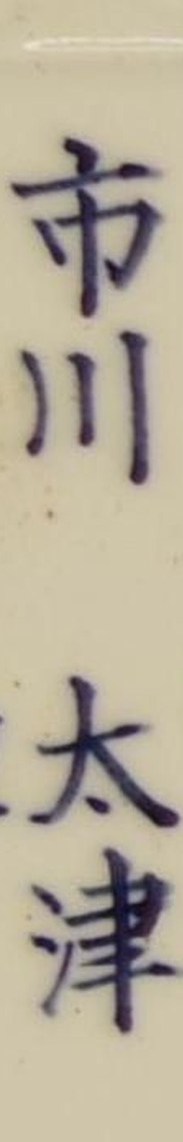市川太津

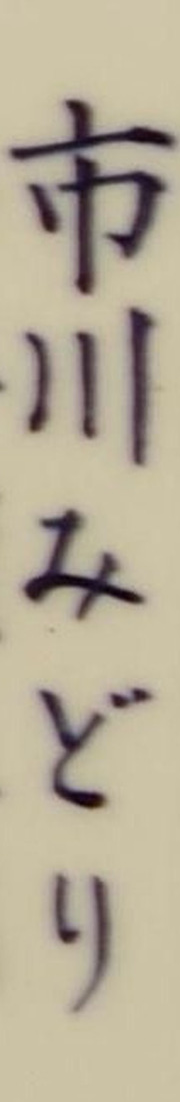市川みどり
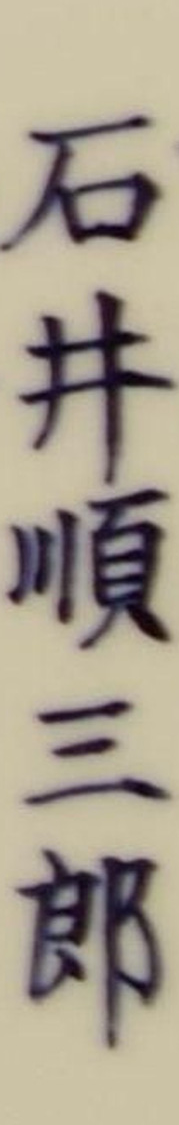石井順三郎
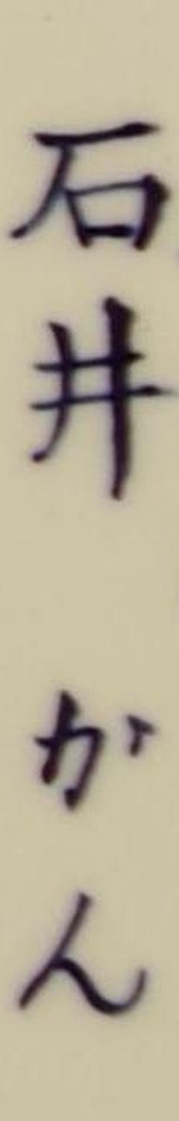石井かん
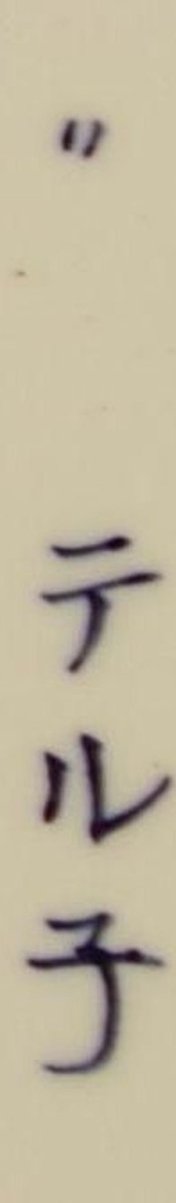テル子
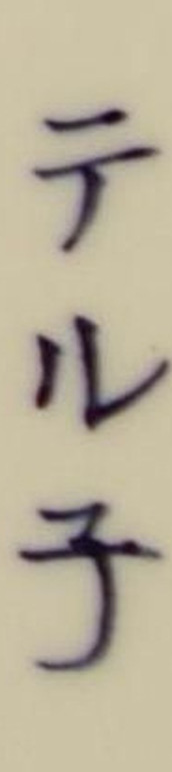テル子
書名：E~L
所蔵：高野山金剛峯寺
